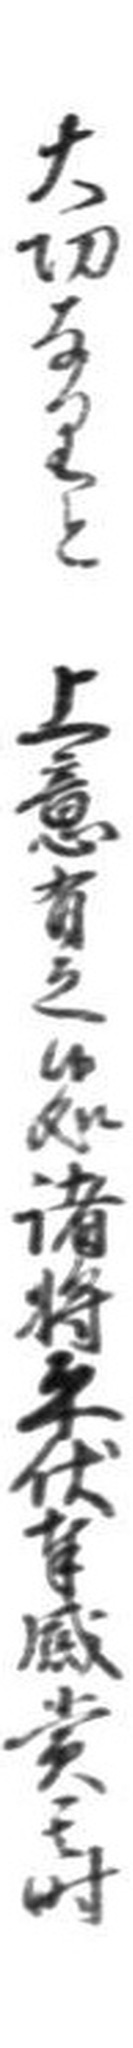大功なりと上意有之候処諸将平伏奉感賞其時
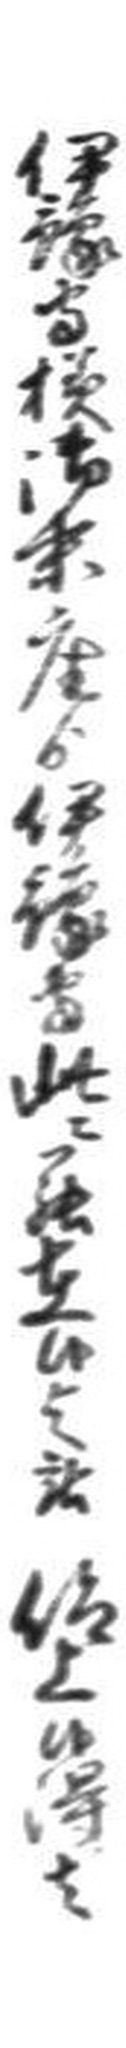伊予守様御末座ゟ伊予守此ニ罷在候与被仰上候得者
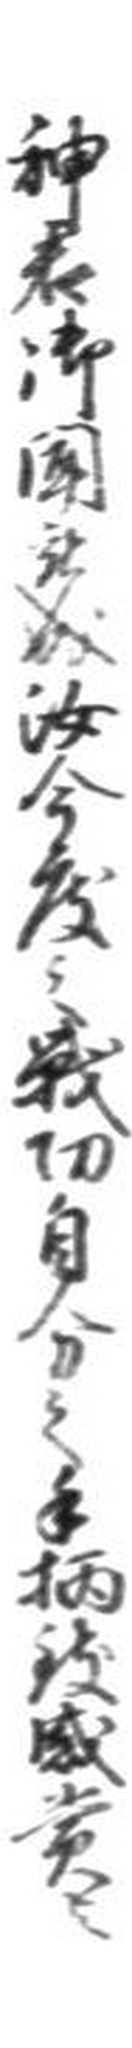神君御聞被成汝今度之戦功自分之手柄致感賞与
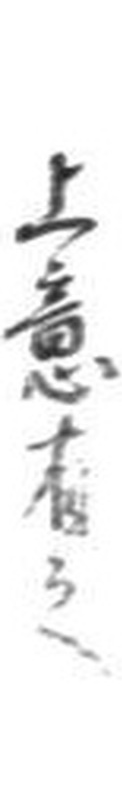上意有之
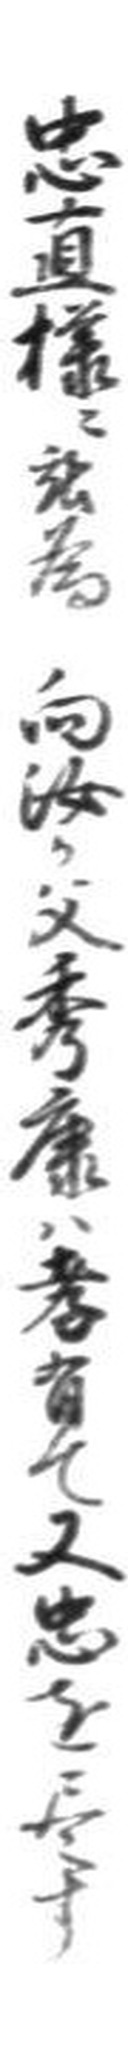忠直様ニ被為向汝か父秀康ハ孝有て又忠を尽す
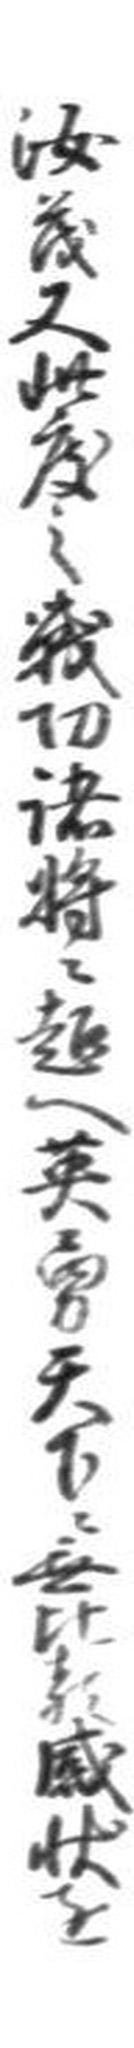汝茂又此度之戦功諸将ニ超へ英勇天下ニ無比類感状を
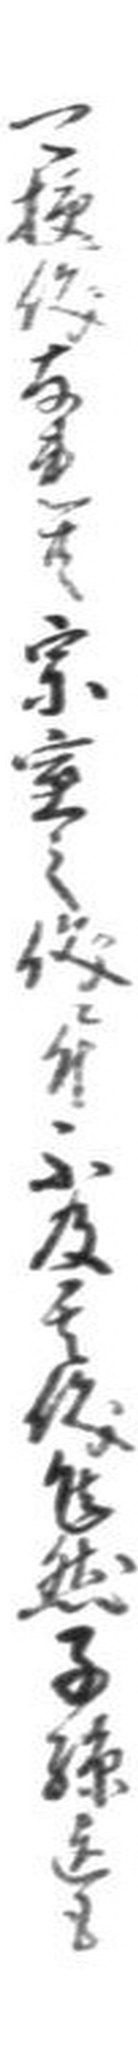可授儀なれ共宗室之儀ニ付不及其儀乍然子孫迄も
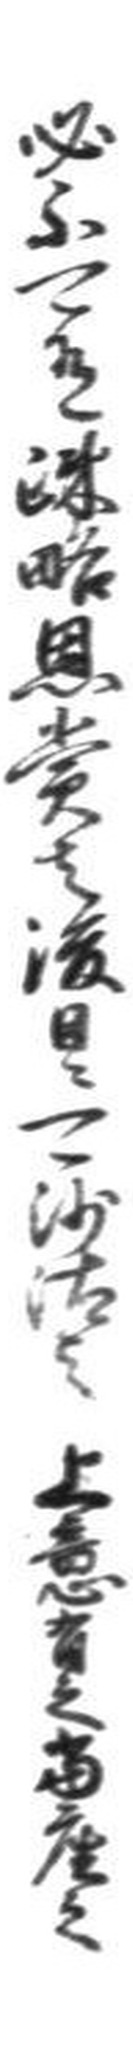必不可有疎略恩賞者後日ニ可沙汰与上意有之当座之

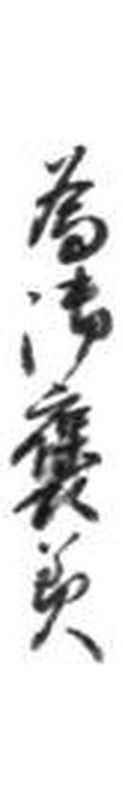為御褒美
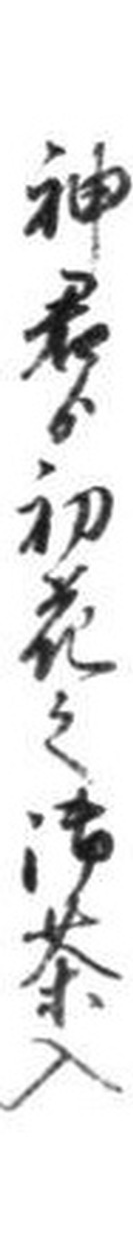神君ゟ初花之御茶入
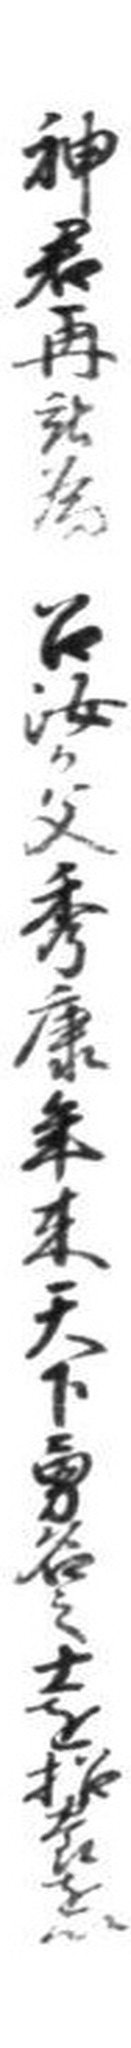神君再被為召汝か父秀康年来天下勇名之士を招養を以
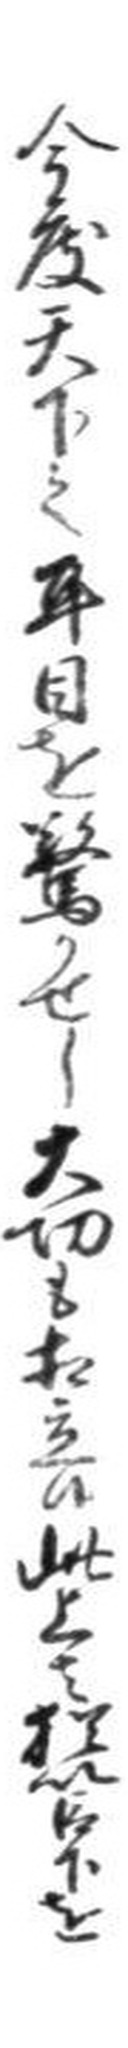今度天下之耳目を驚かせし大功も相立候此上者猶以臣下を
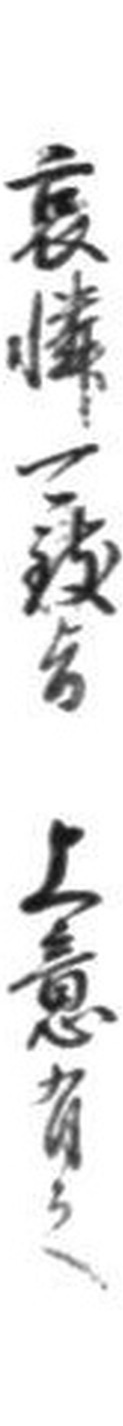哀憐可致旨上意有之
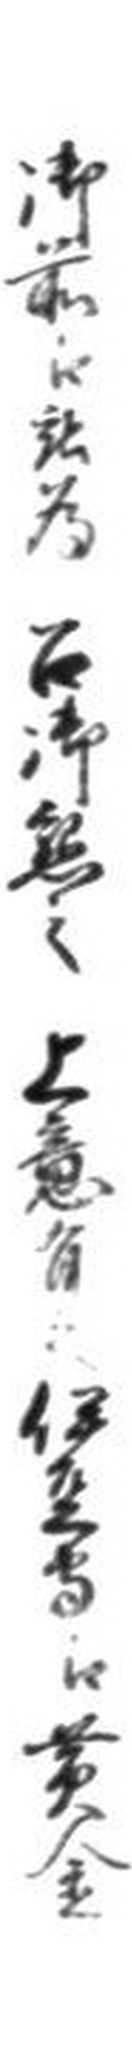御前江被為召御懇之上意有之伊豆守江貰金
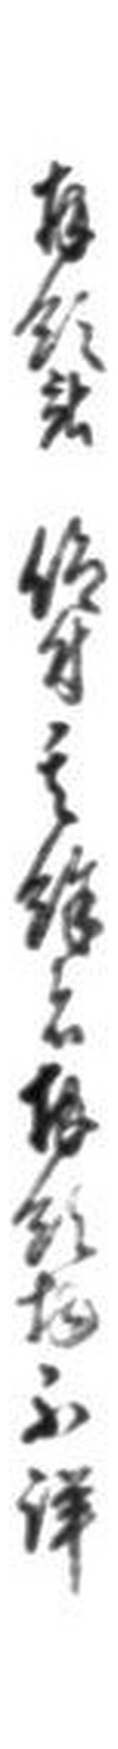拝領被仰付其余者拝領物不詳
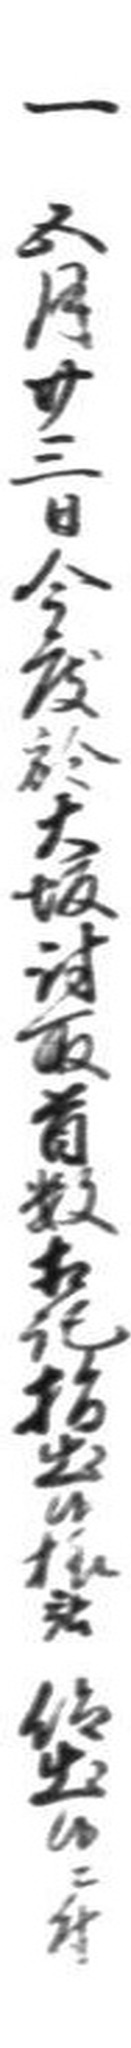一五月廿三日今度於大坂討取首数相記指出候様被仰出候ニ付
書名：家譜 二 忠直公 従文禄四年到慶安四年
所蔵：福井県文書館 Fukui Prefectural Archives
